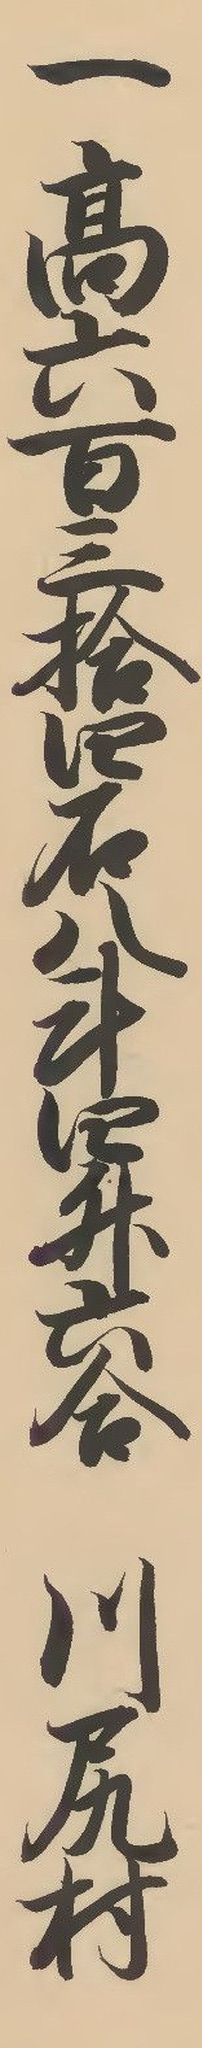一高六百三拾四石八斗四升六合川尻村

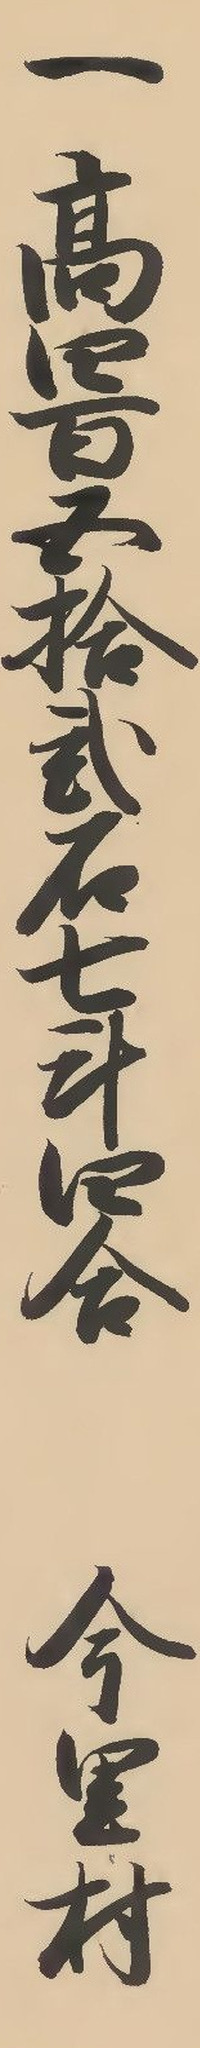一高四百五拾弐石七斗四合今里村
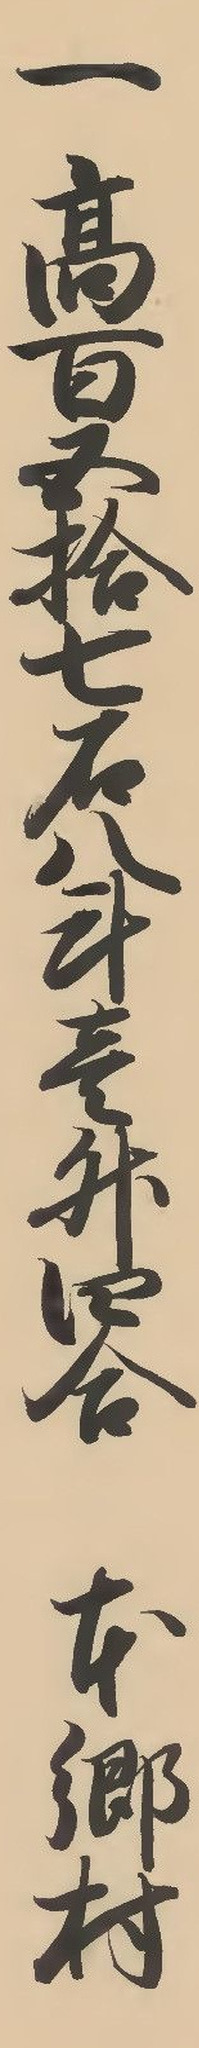一高百五拾七石八斗壱升四合本郷村
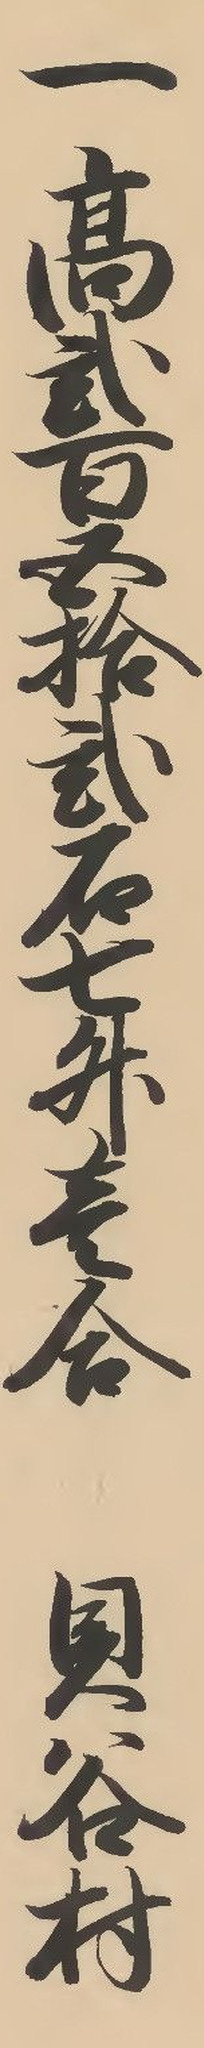一高弐百五拾弐石七升壱合貝谷村
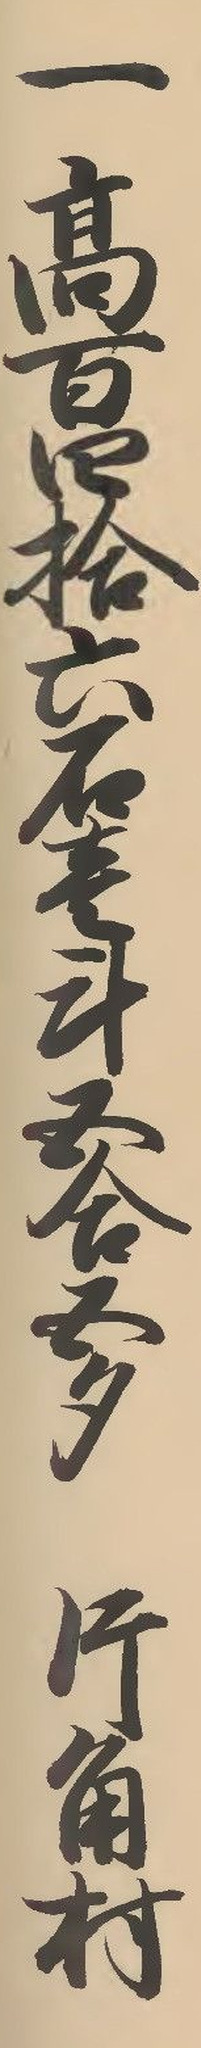一高百四拾六石壱斗五合五勺片角村
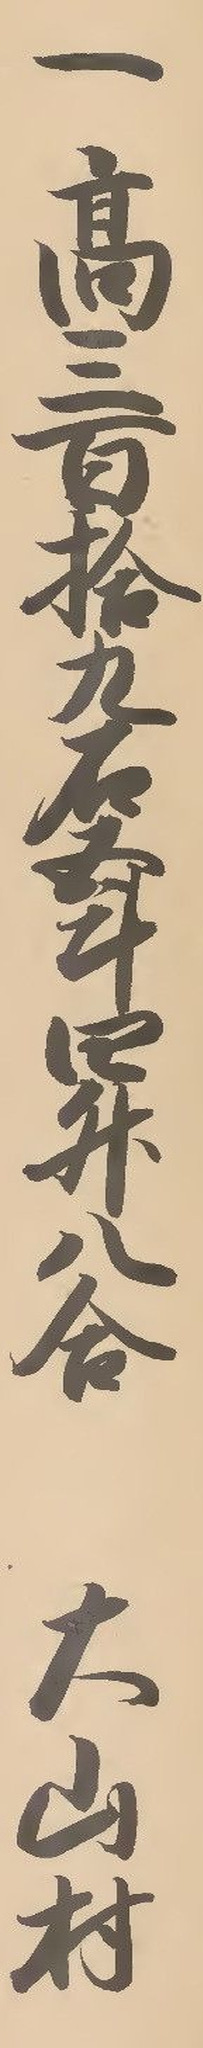一高三百拾九石五斗四升八合大山村
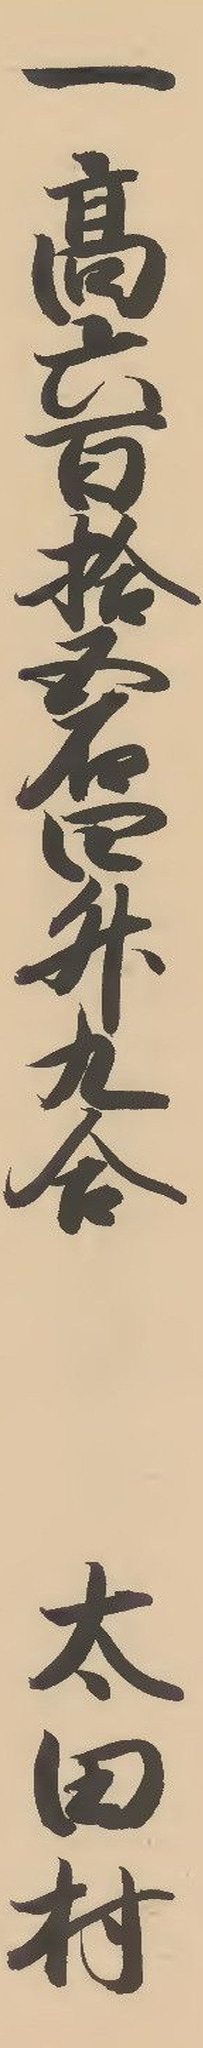一高六百拾五石四升九合太田村
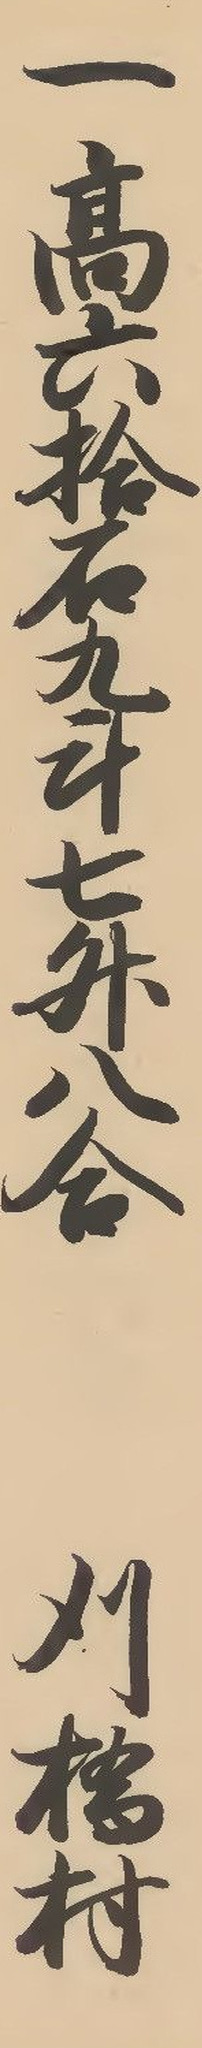一高六拾石九斗七升八合刈橋村
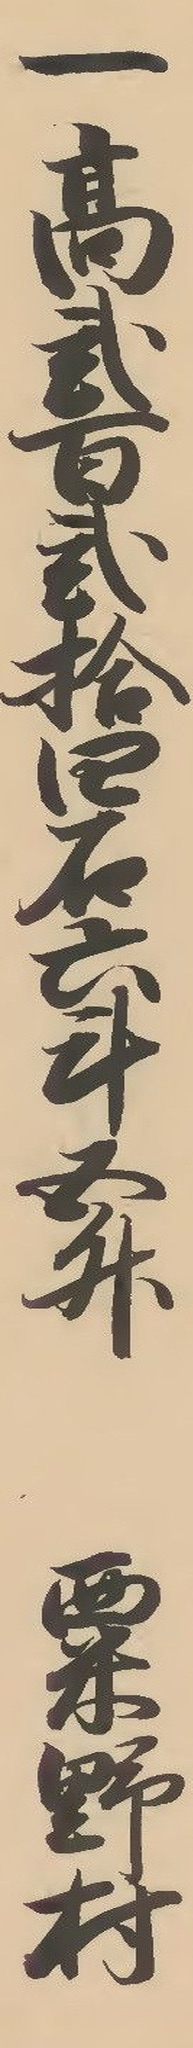一高弐百弐拾四石六斗五升粟野村

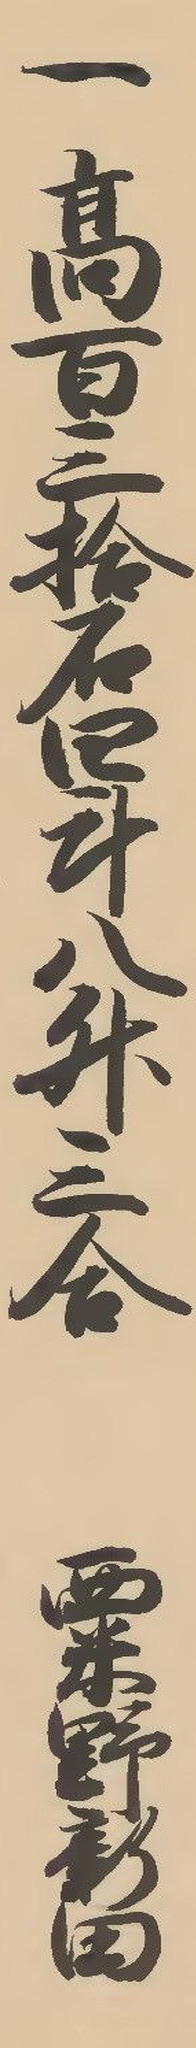一高百三拾石四斗八升三合粟野新田
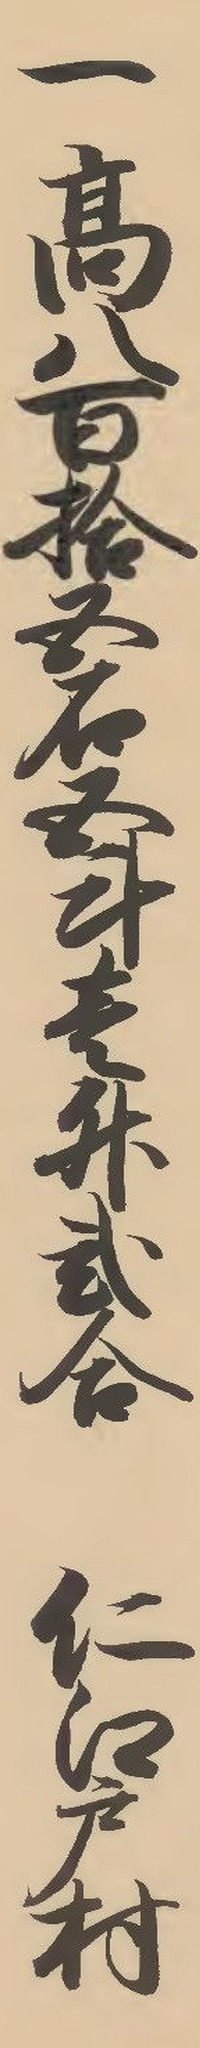一高八百拾五石五斗壱升弐合仁江戸村
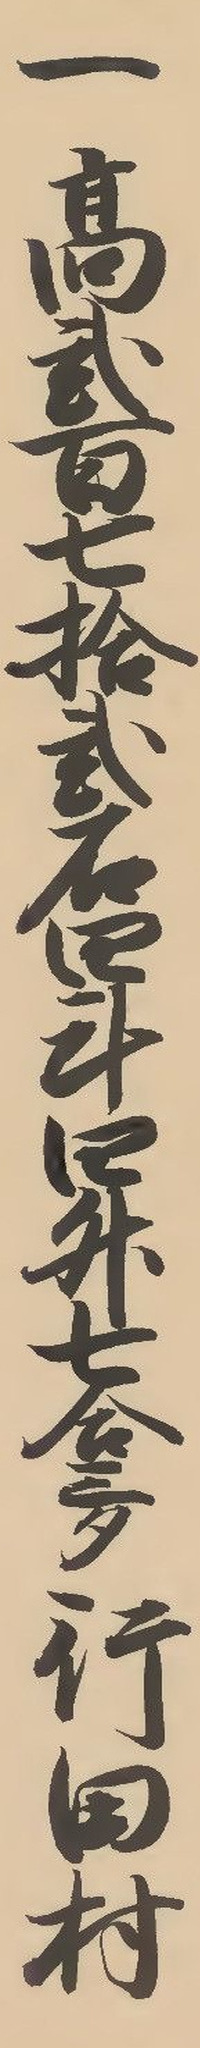一高弐百七拾弐石四斗四升七合三勺行田村
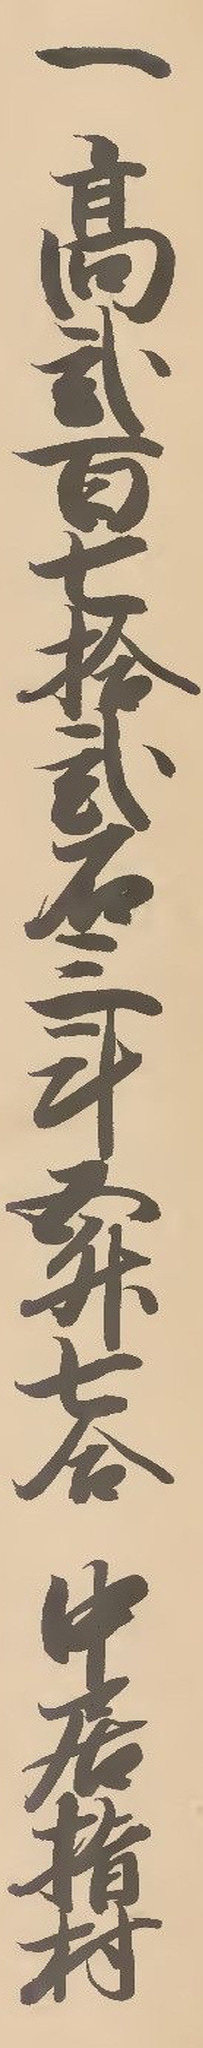一高弐百七拾弐石三斗五升七合中居指村
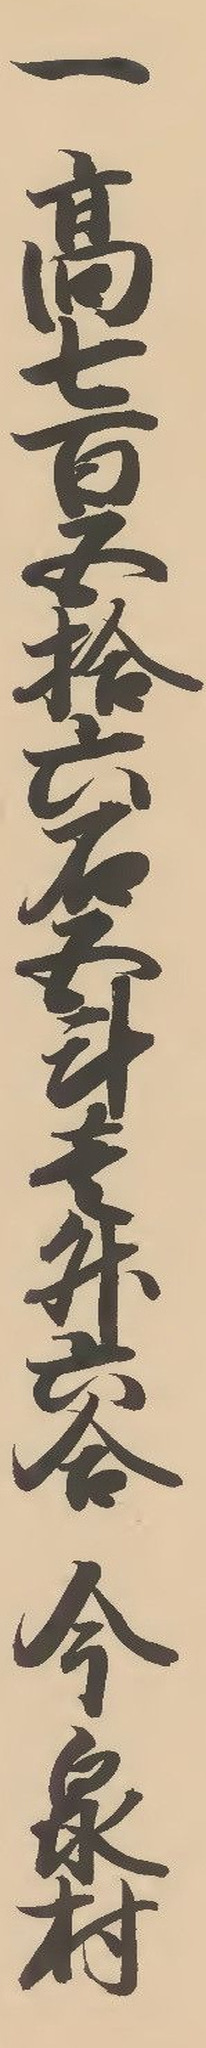一高七百五拾六石五斗壱升六合今泉村
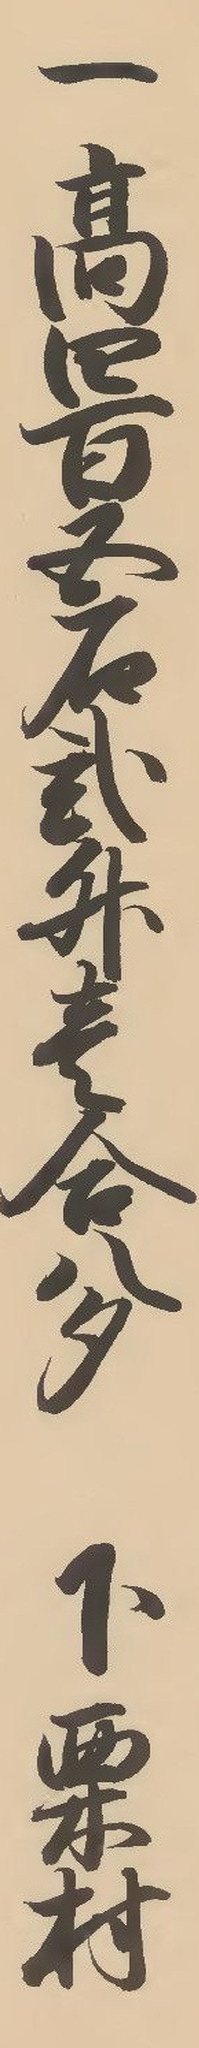一高四百五石弐升壱合八勺下栗村
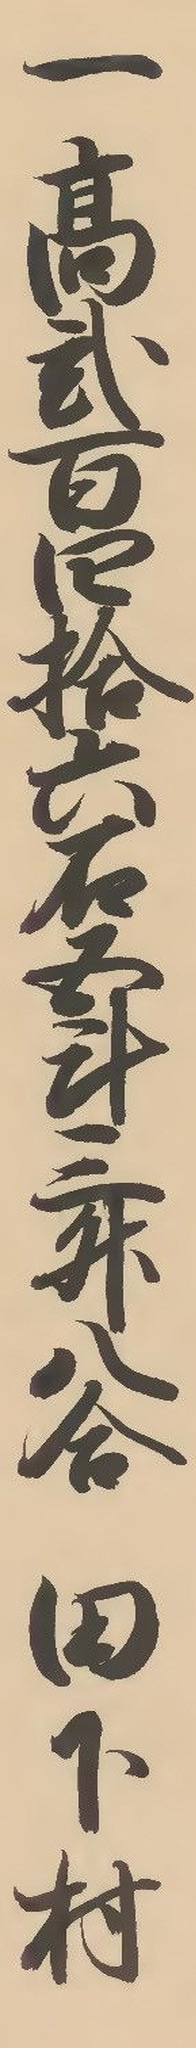一高弐百四拾六石五斗三升八合田下村
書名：下総国郷帳
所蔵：国立公文書館 National Archives of Japan
